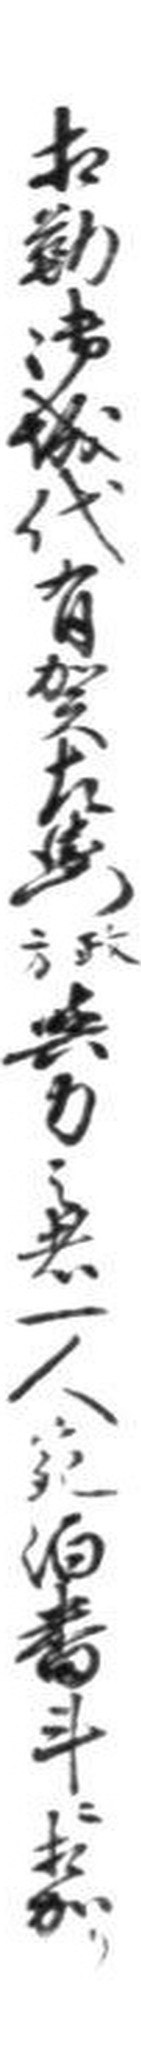相勤御城代有賀左衛門政方与力之者一人宛泊番斗に相加り
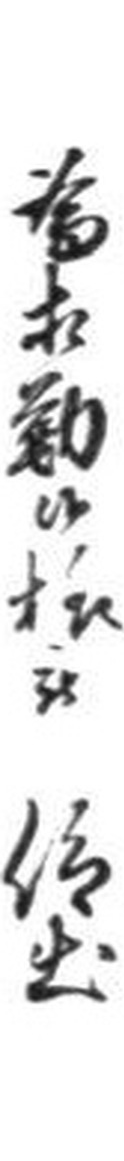為相勤候様被仰出
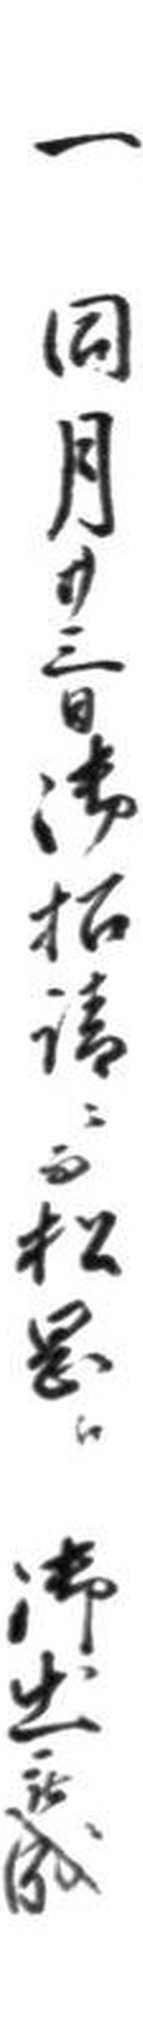一同月廿三日御招請に而松岡江御出被成
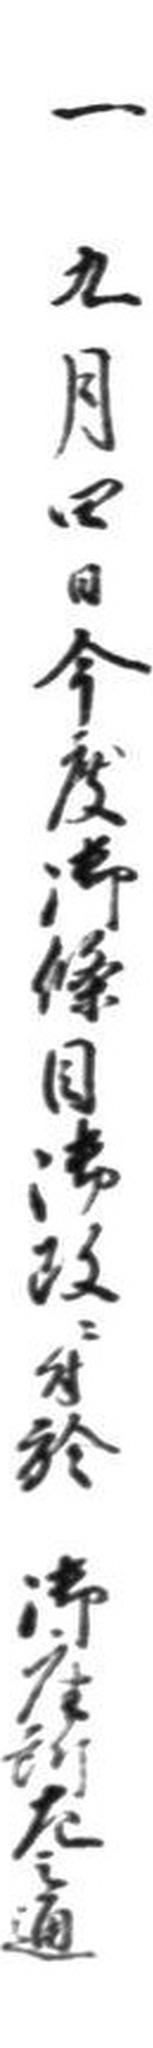一九月四日今度御条目御改に付於御座所左之通
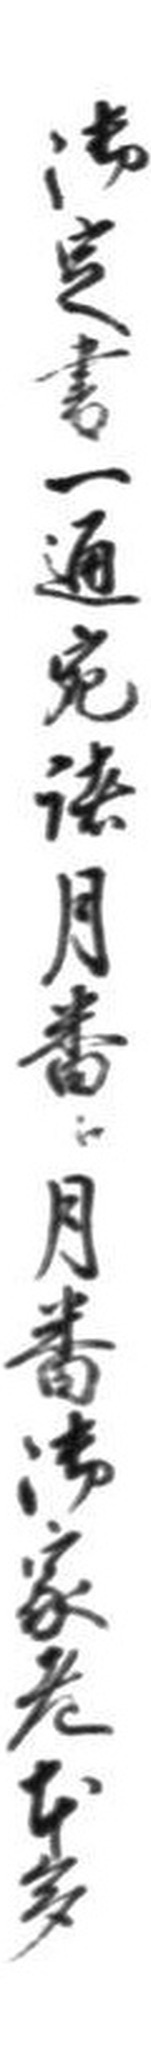御定書一通宛諸月番江月番御家老本多
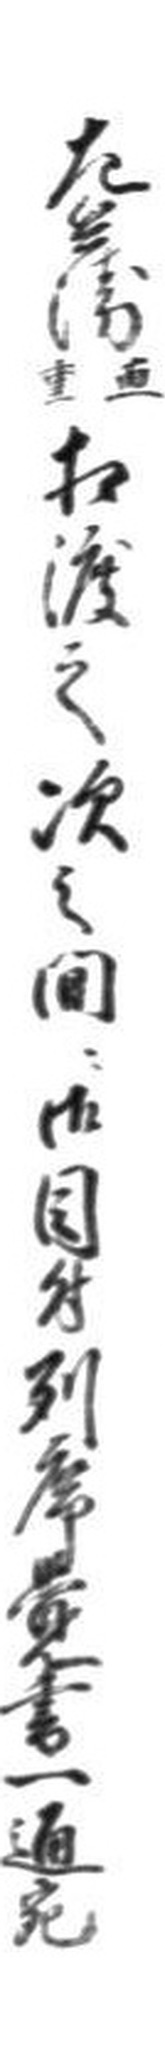佐兵衛直重相渡之次之間に御目付列席覚書一通宛
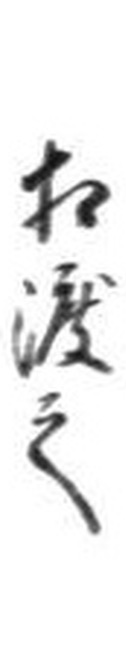相渡之
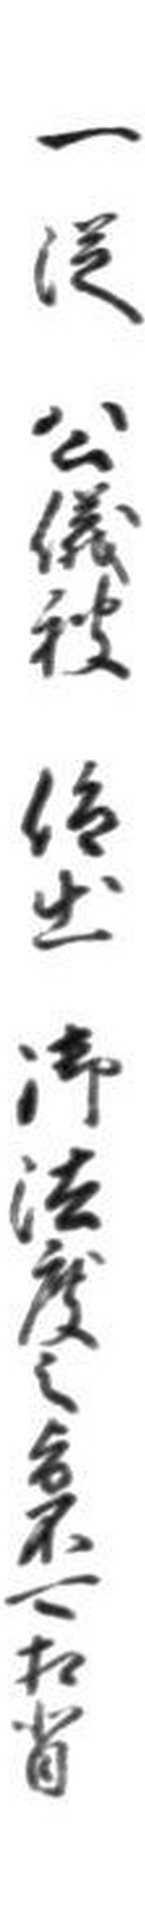一従公儀被仰出御法度之旨不可相背
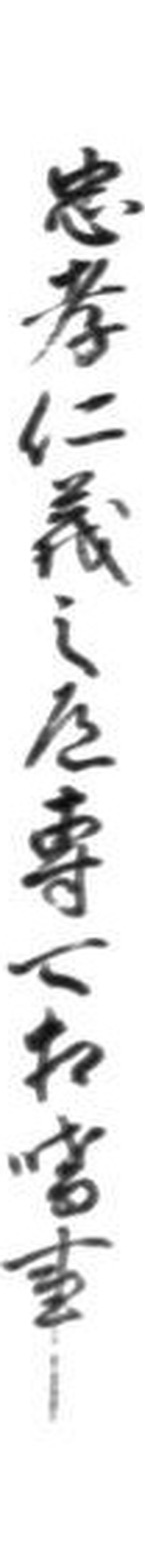忠孝仁義之道専可相嗜事
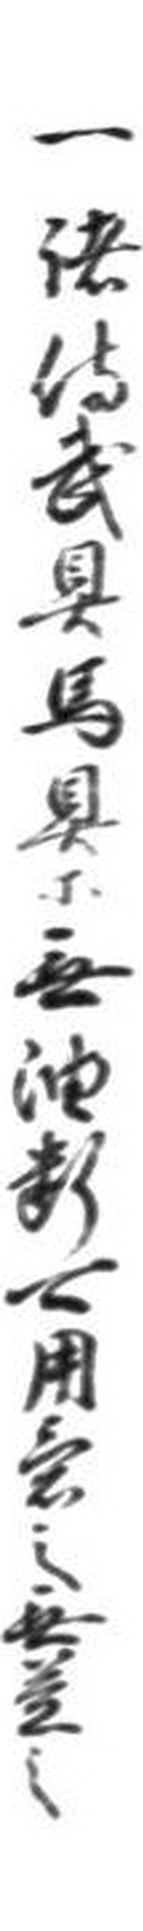一諸侍武具馬具等無油断可用意之無益之

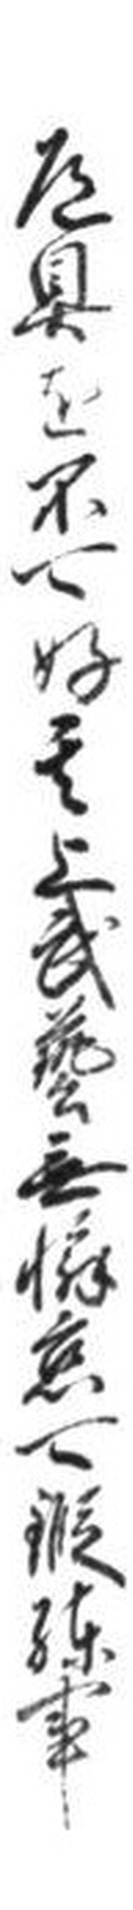道具を不可好其上武芸無懈怠可鍛練事
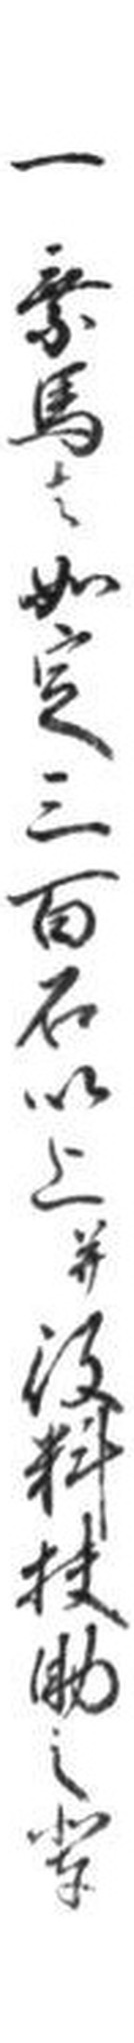一乗馬は如定三百石以上并役料扶助之輩
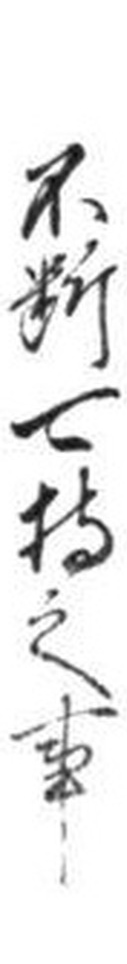不断可持之事
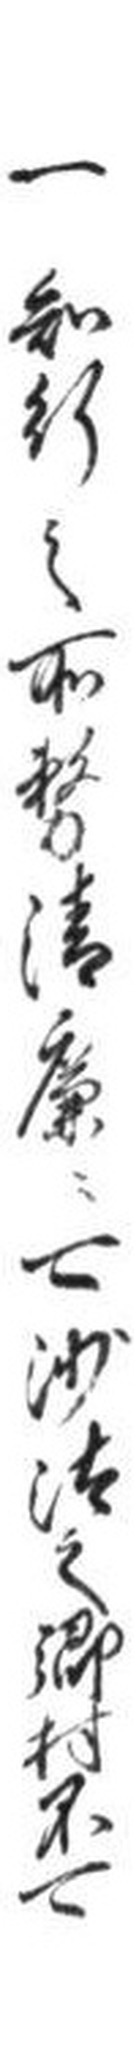一知行之所務清廉に可沙汰之郷村不可
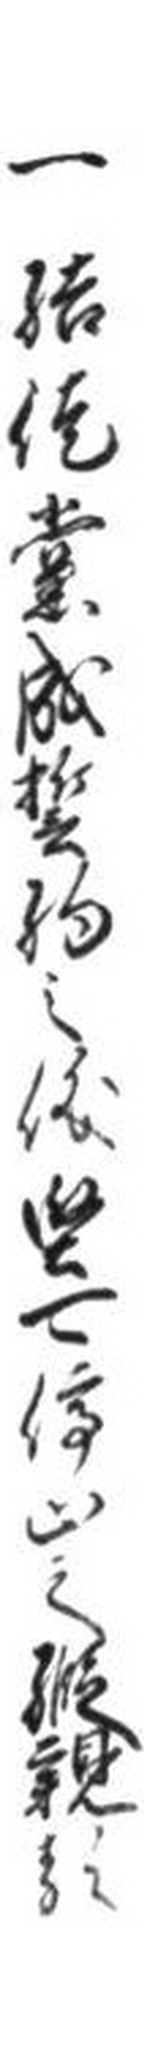一結徒党成誓約之儀堅可停止之縦親類
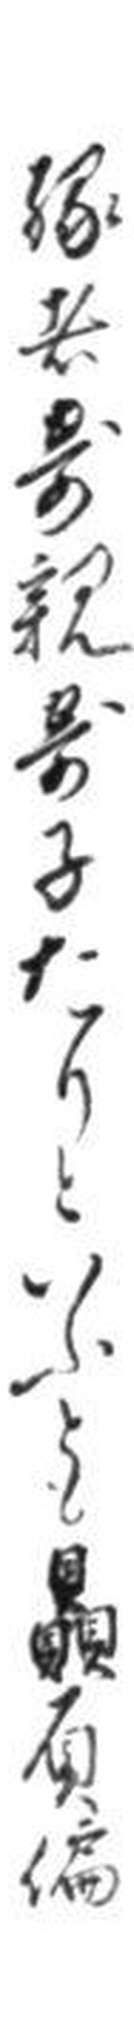縁者寄親寄子たりといふとも贔屓偏
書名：家譜 十六 吉品公 従貞享三年閏三月到同四年
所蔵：福井県文書館 Fukui Prefectural Archives
